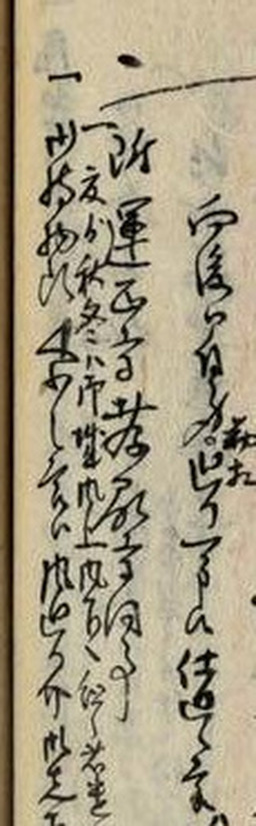附運正寺孝顕寺同事
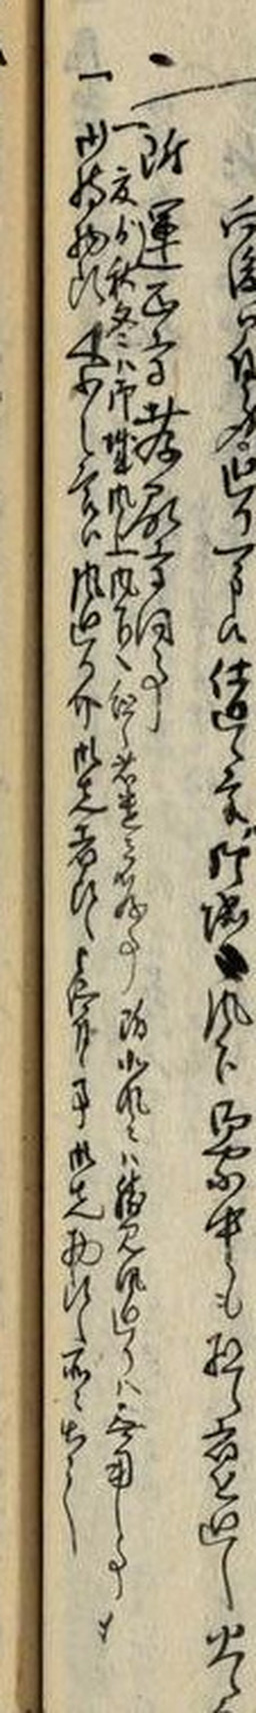一夏ゟ秋冬は御城風上風下へ組之者遣に不及事附北風には勝見風廻りは無用之事
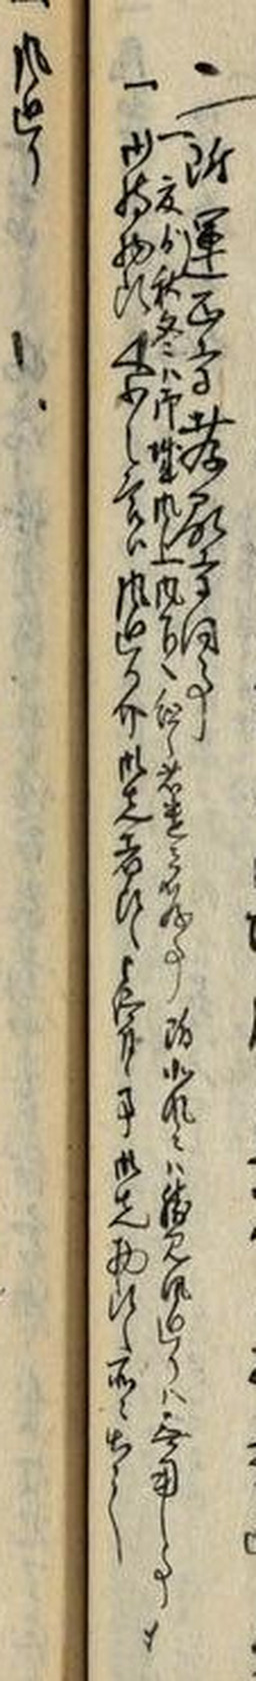一御持物頭人少之節は風廻り介御先者頭へ被仰付候事御先物頭之所に出之
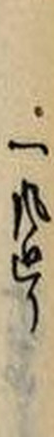一風廻り
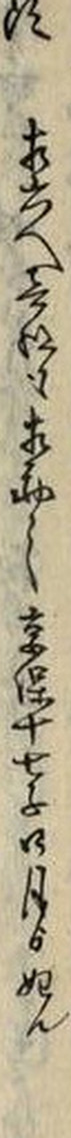御先物頭於六人壱組ツヽ相勤之享保十七子四月ゟ始ル
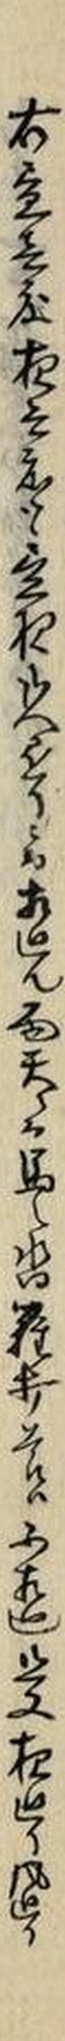右昼壱度夜壱度ツヽ昼夜弐人懸りにて相廻ル雨天にて馬之沓難打節は不相廻且又夜廻り風廻り
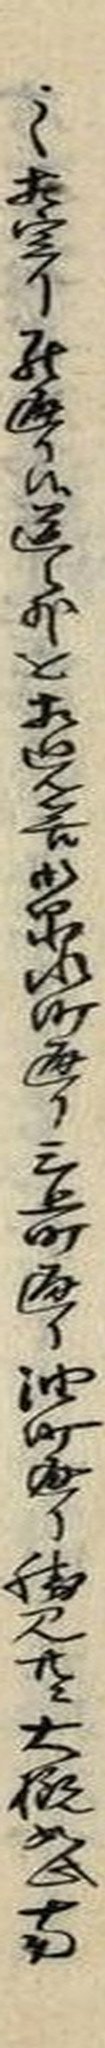之相定り罷通り候道之外を相廻ル筈御泉水町通り三上町通り油町通り勝見共に大概如此南
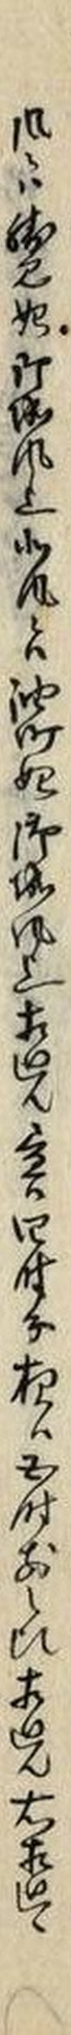風には勝見始御城風上北風には油町始御城風上相廻ル昼は四時分夜は五時前之頃相廻ル右相廻候
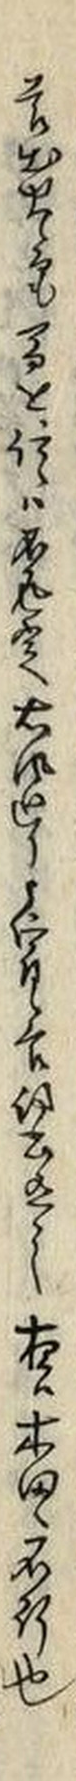節出火候ても馬を得候は不返定右風廻り被仰付候節伺書有之夜は木田へ不行也
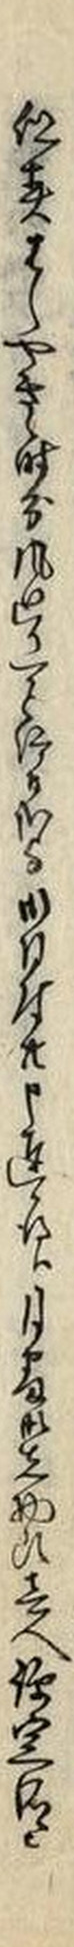但春はしやき候時分風廻り可被仰付哉と御目付共申達候得は月番御先物頭壱人評定所へも
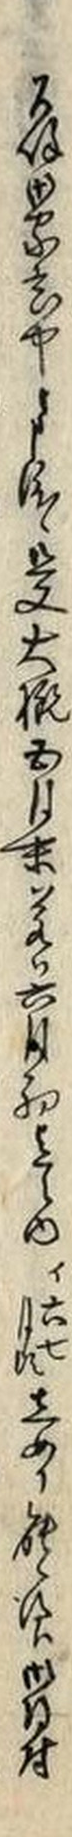召呼御家老中被申渡候且又大概五月末若は六月初迄之内イ六七月頃しめり能候得は御目付
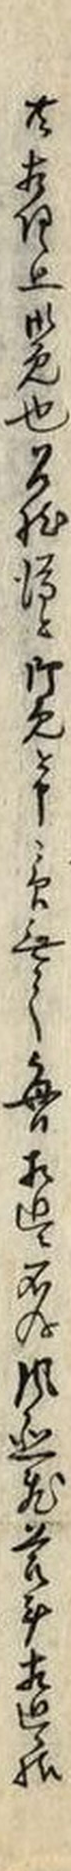共相伺候上御免也乍然慥と御免と申にては無之毎日相廻に不及風烈敷節斗相廻候様
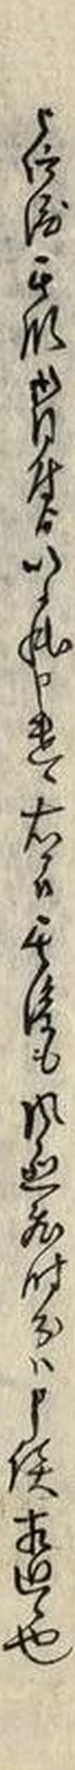被仰渡其段御目付ゟ以手紙申遣候右に付其後も風烈敷時分は申談相廻候也
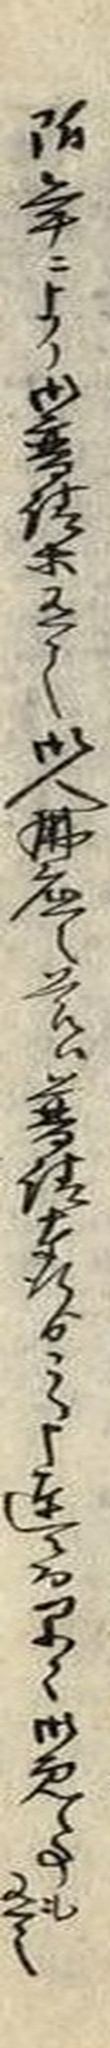附年により御普請等有之御人払底之節は普請奉行ゟ之申達にて早々御免候事も有之
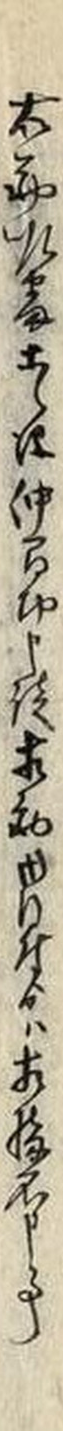右勤順番等之儀仲間切申談相勤御目付ゟは相構不申事
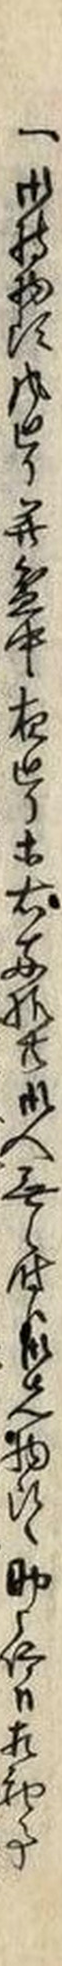一御持物頭風廻り并盆中夜廻り等右両様共御人無之時は御先物頭へ助被仰付相勤候事
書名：御城下諸事之部
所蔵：福井県文書館 Fukui Prefectural Archives
